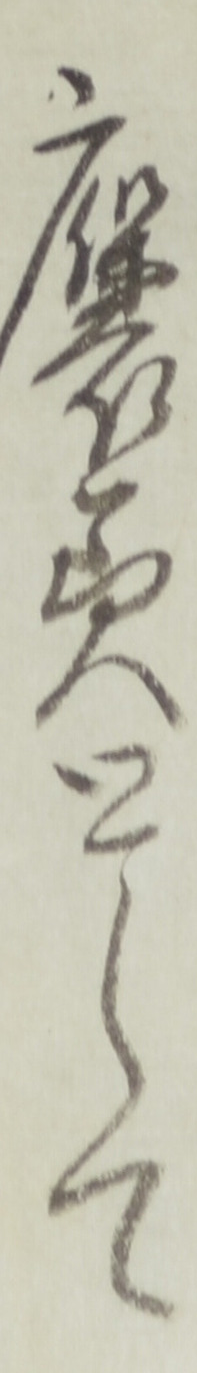褒美として
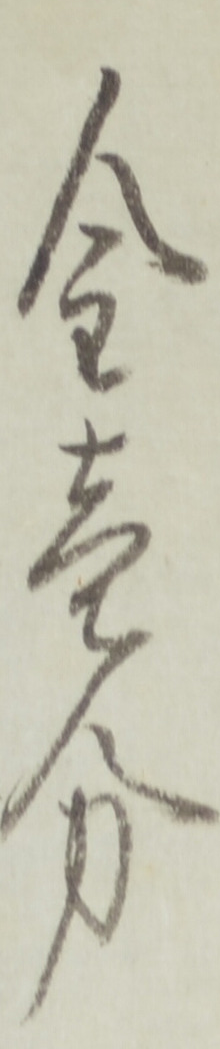金壱分
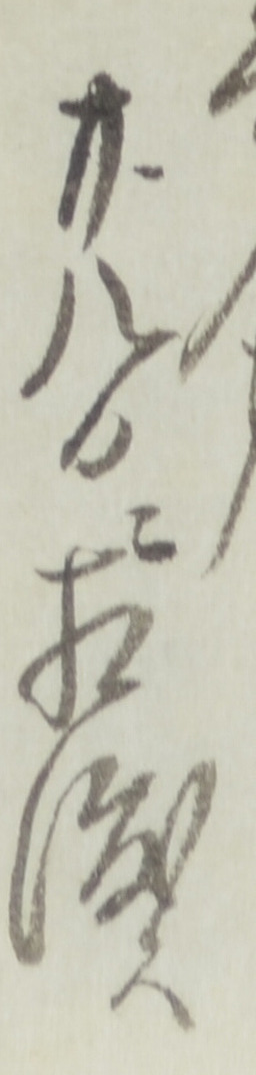廿八日ニ相渡ス
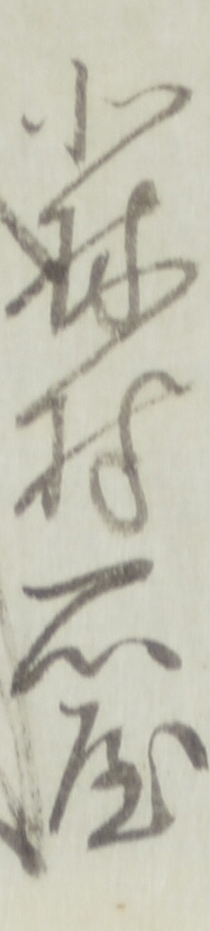北林村石屋
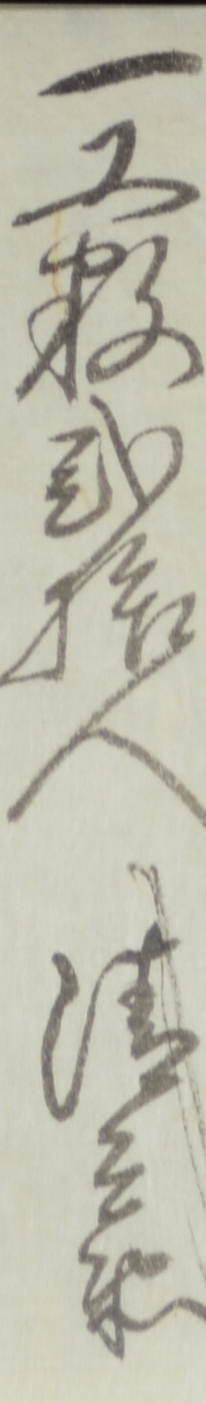一工数弐拾人清兵衛
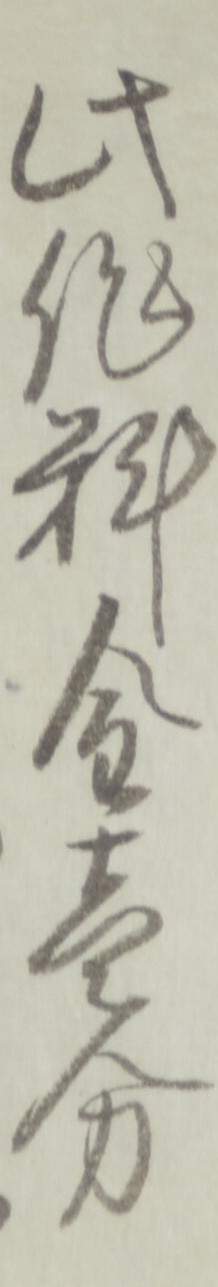此作料金壱分
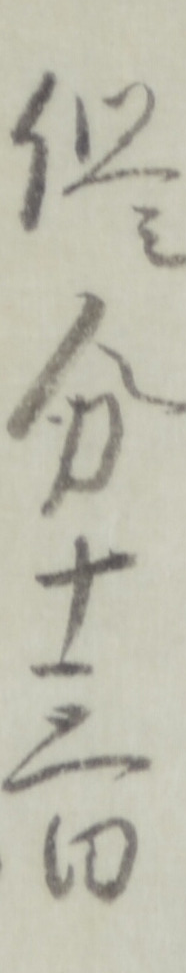但シ分十三日
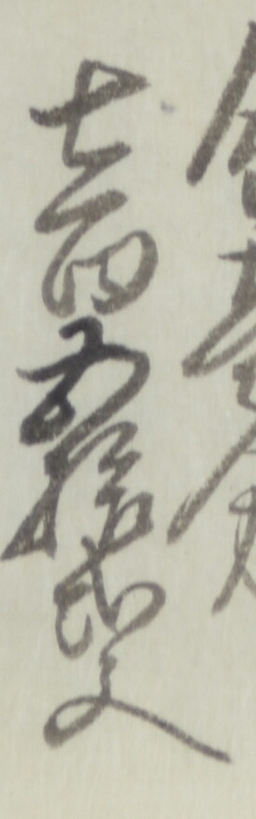七百五拾弐文
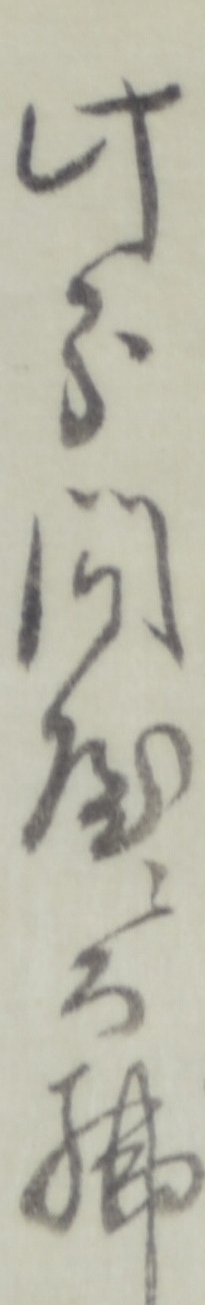此分問屋ニ而払
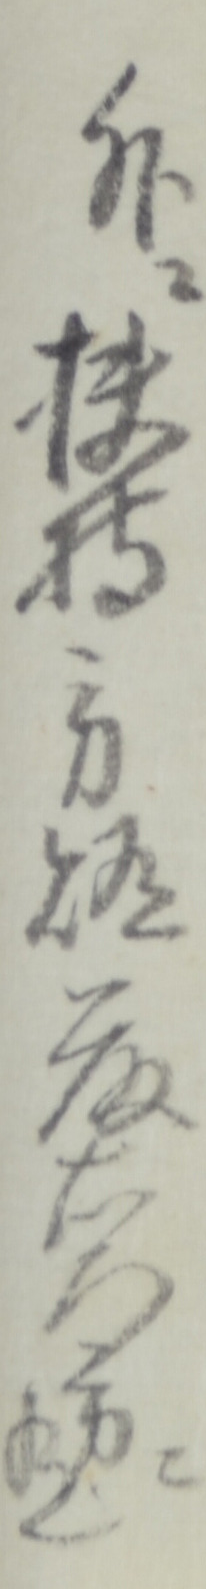外ニ扶持方賄藤右衛門方ニ有

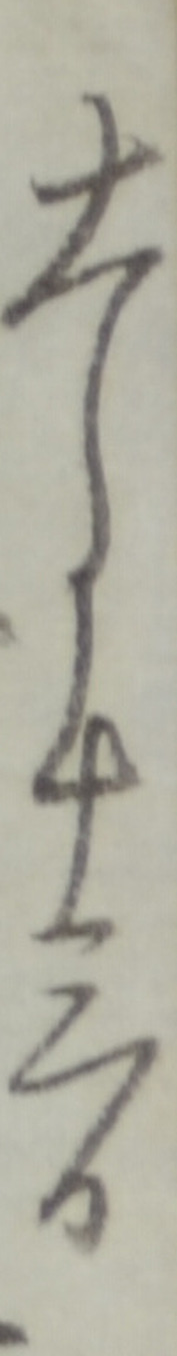十一月十三日
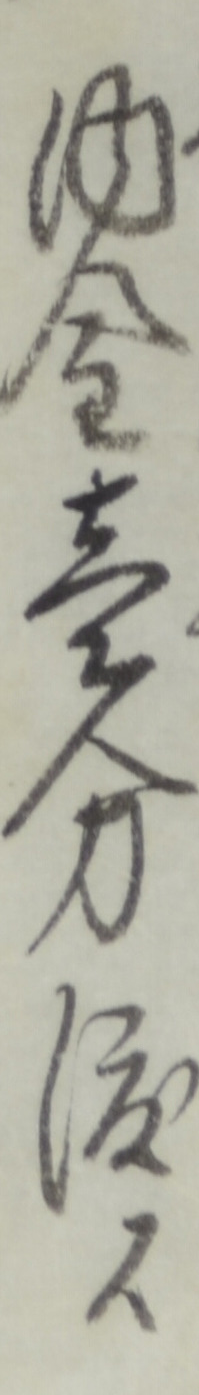内金壱分渡ス
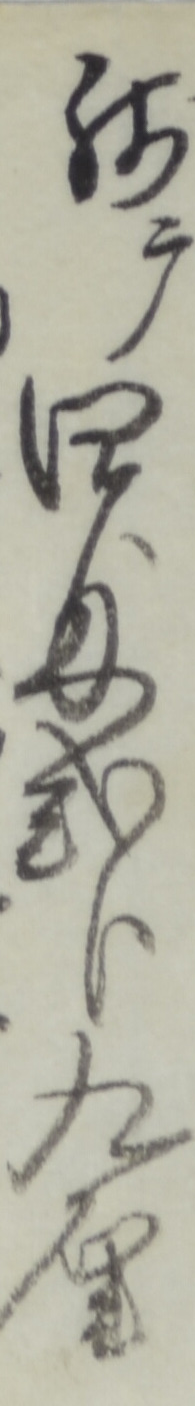残テ四匁弐分九厘
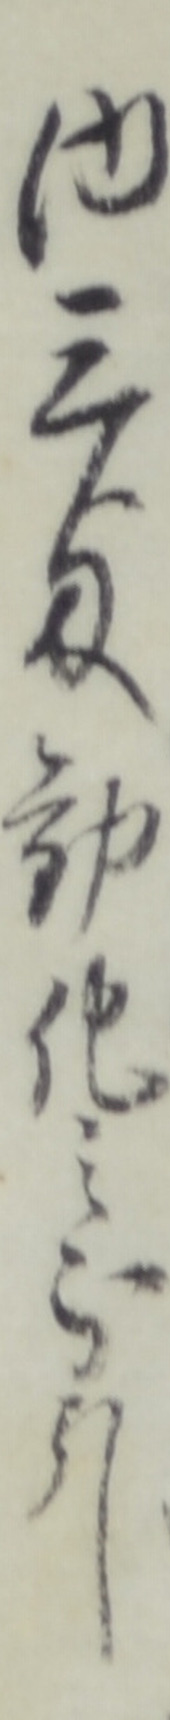内三匁勧化之分引
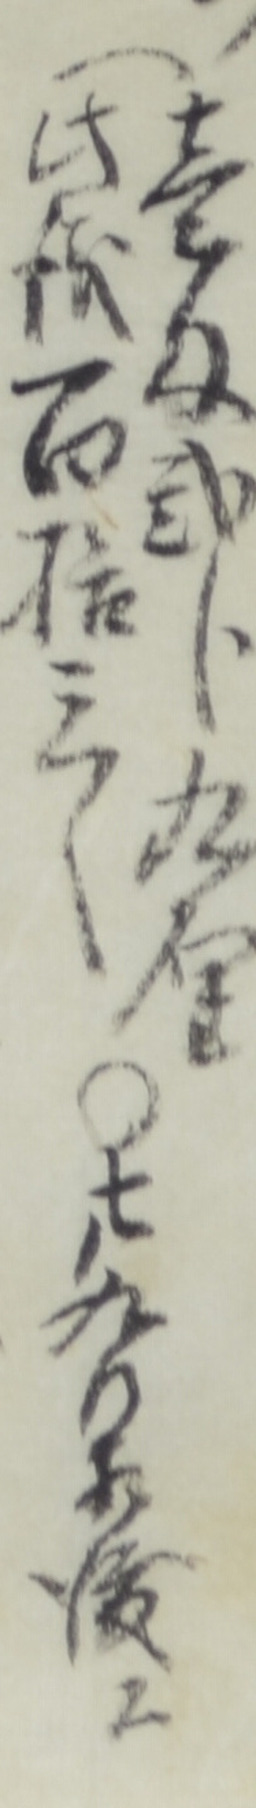此銭百拾三文〇廿九日相渡ス
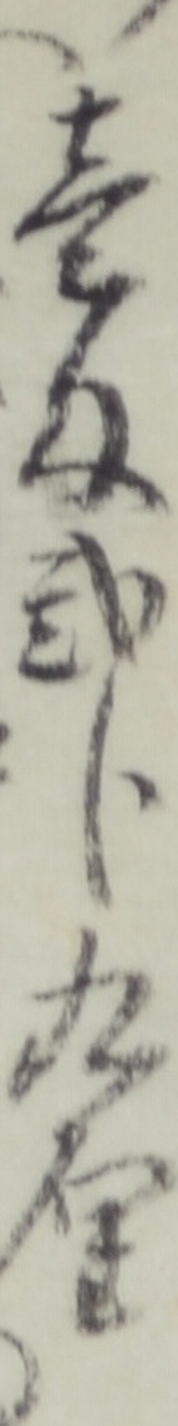残壱匁弐分九厘
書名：権現分拂方
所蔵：伊那市立高遠町図書館・合同会社AMANE
